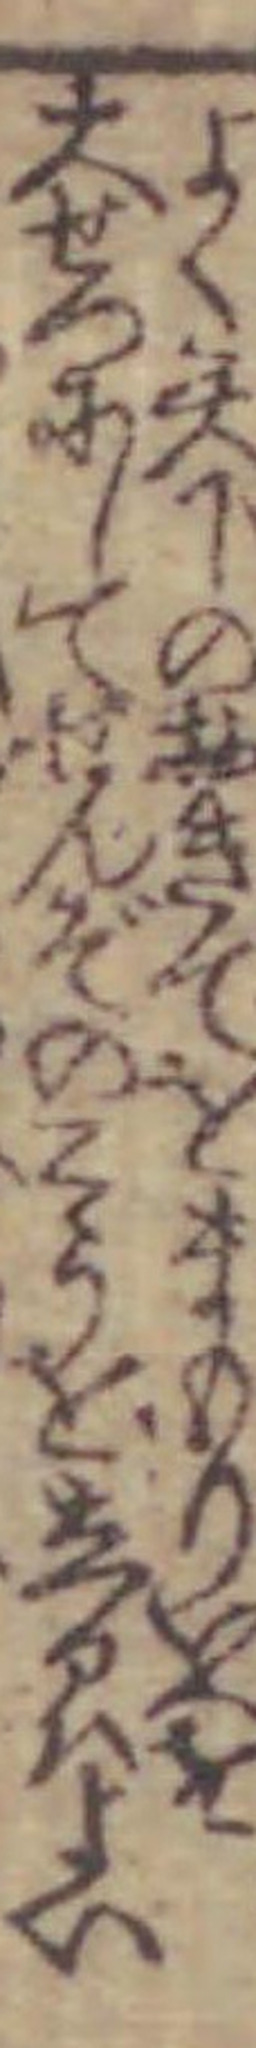大せつにしてせんぞのこうをしるはよい
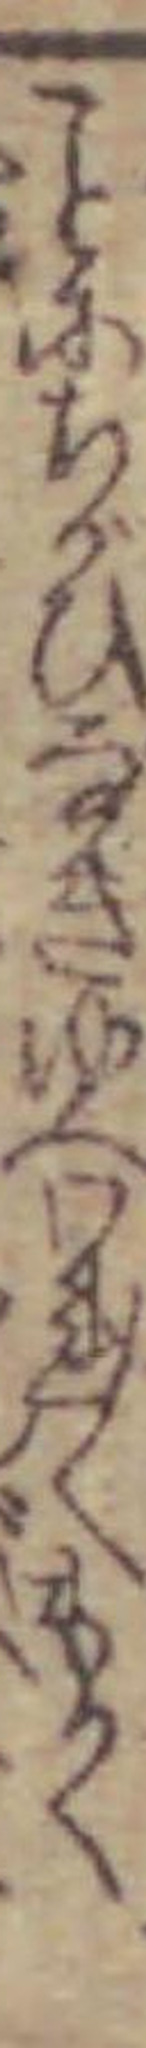ことにちがひなきゆへわれ〳〵もかく
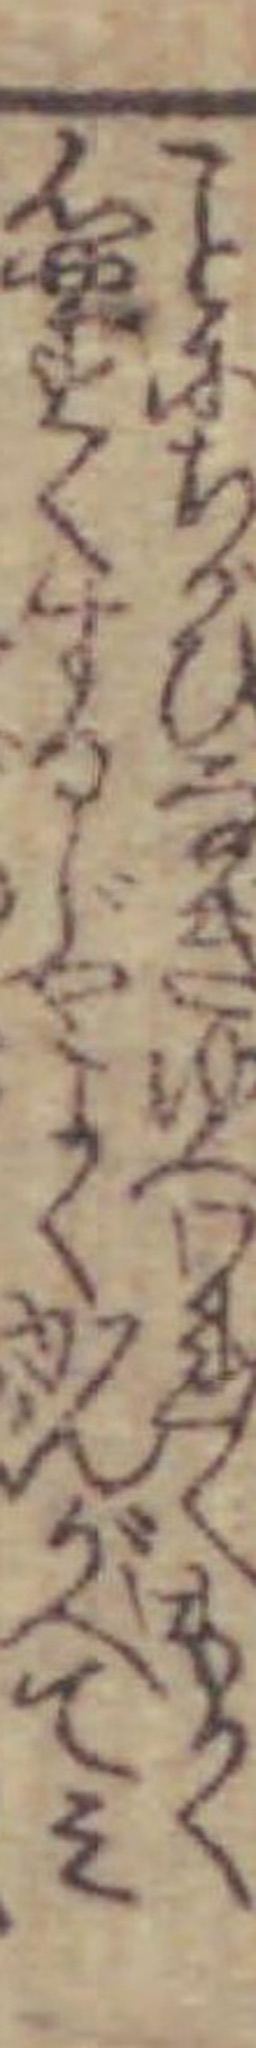心やすくするじやよくかんがへてみ
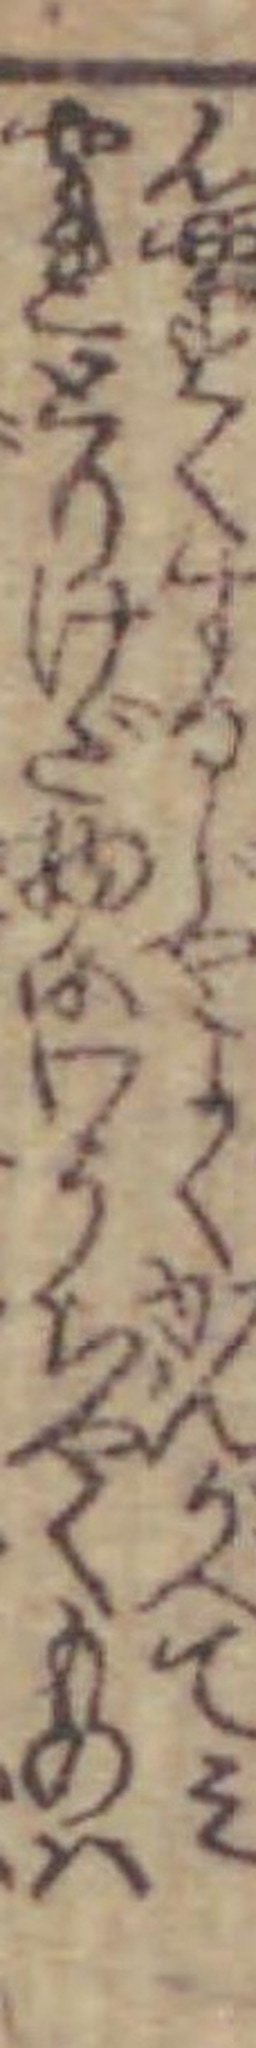やれとりけだ物にわうちやくものは
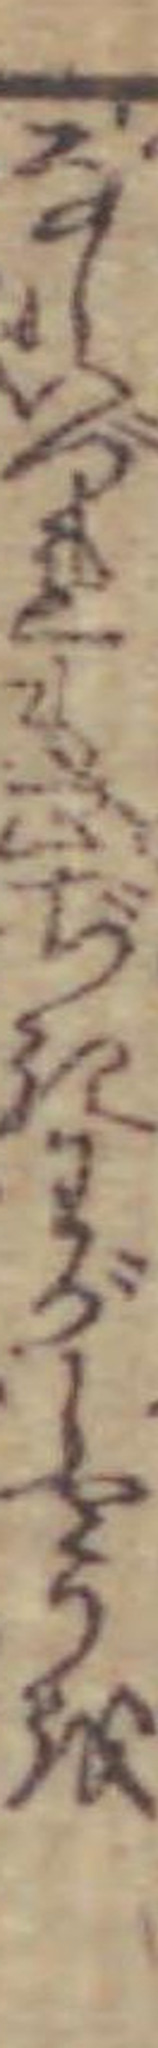なしいづれも正ぢきわがしやうを
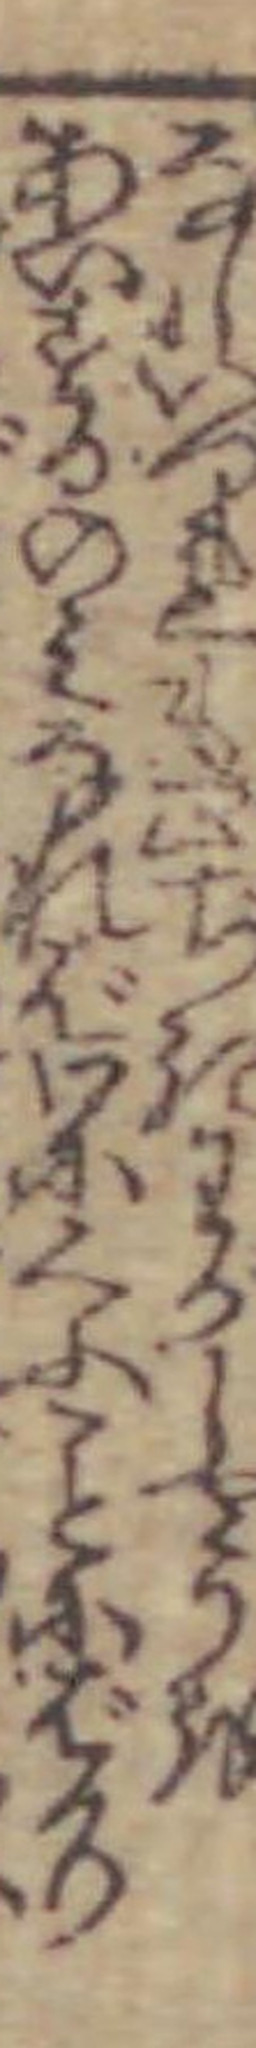あいするのみなれば口？にくふことにばかり
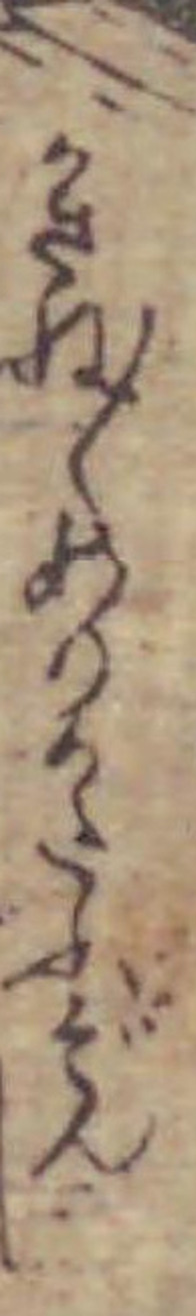かさね〳〵ありかたふぞんし
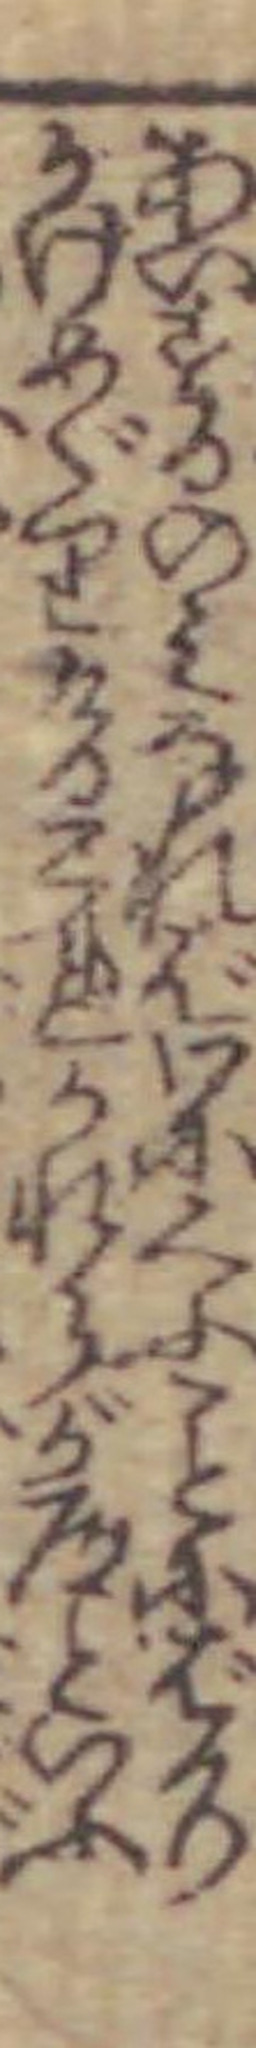かけめぐりけるこれかれらが道といふ
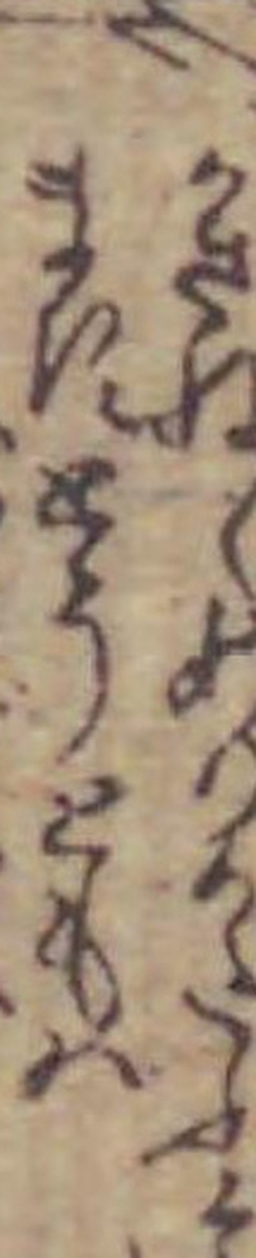ますとうともは
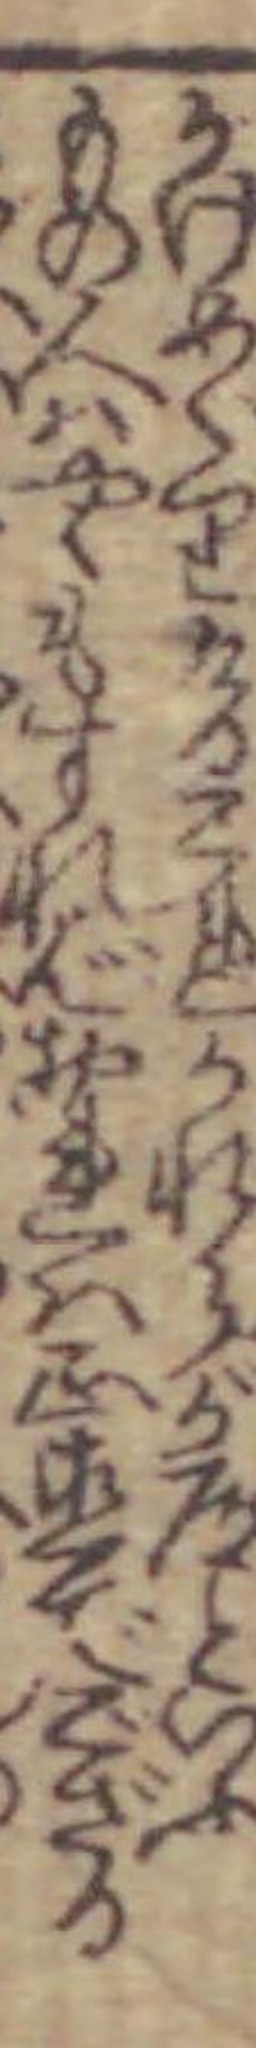もの人はやゝもすればおれは正直でござる
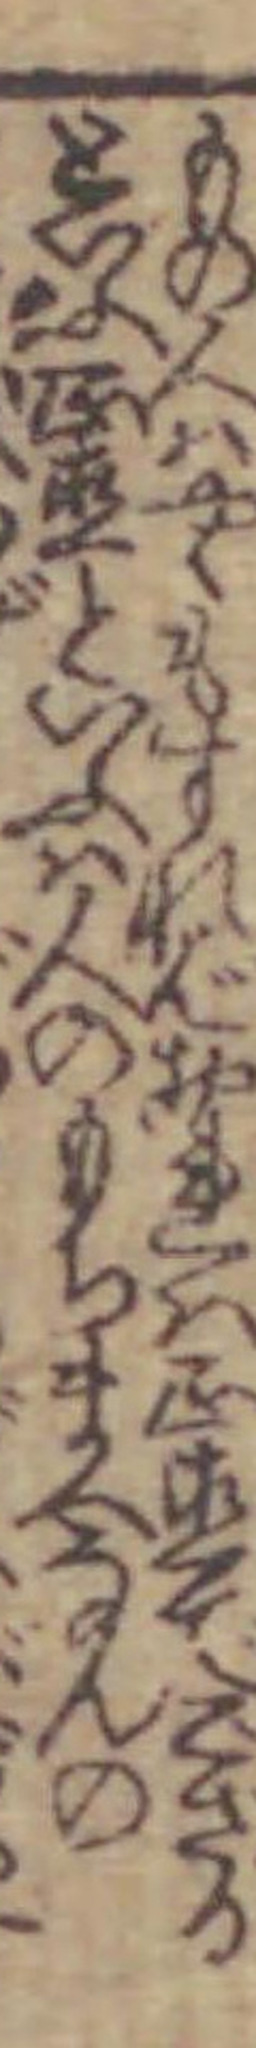といふ正直といふは人のもちまへなんの
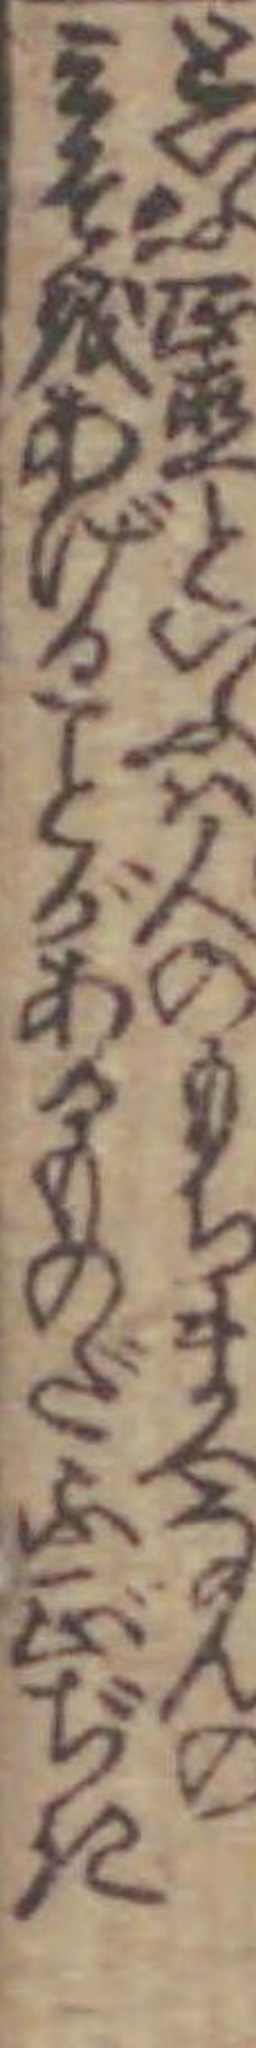みそをあげることがあるものだふ正ぢき
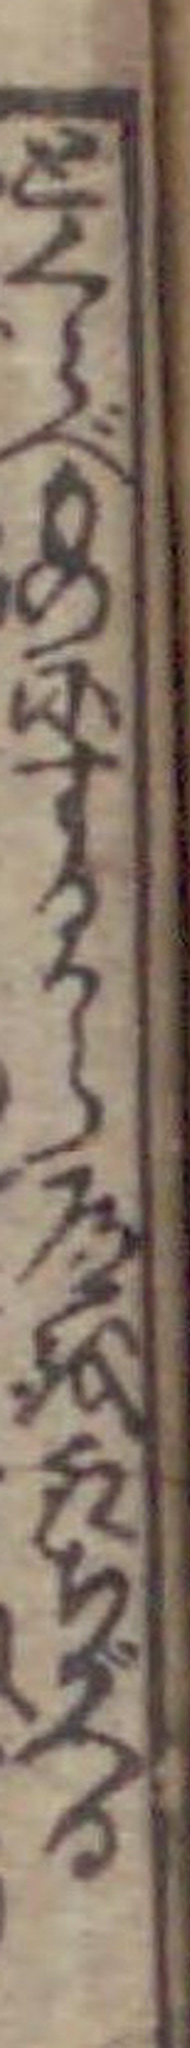とくらべものにするから道を取ちがへる
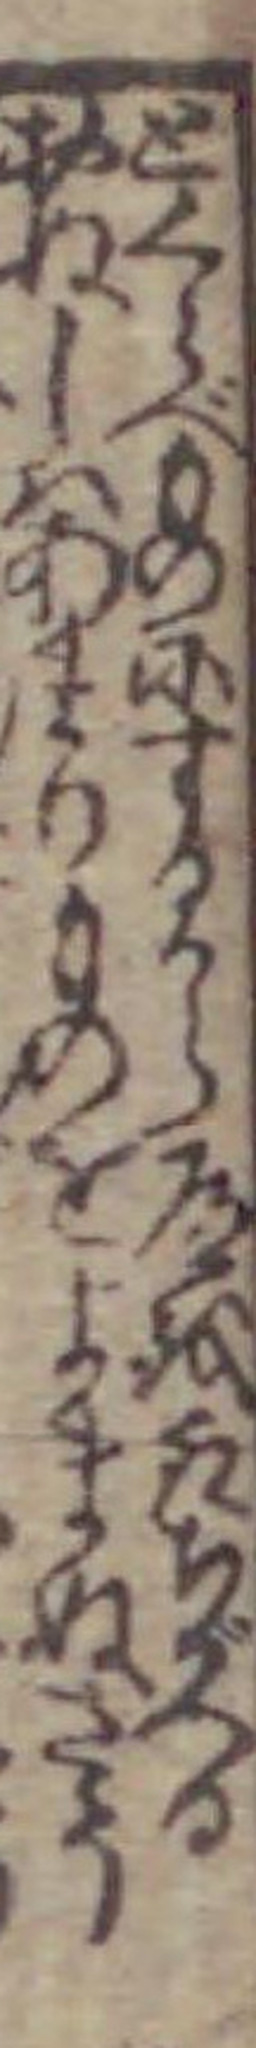おぬしはあまりものをよまぬさう
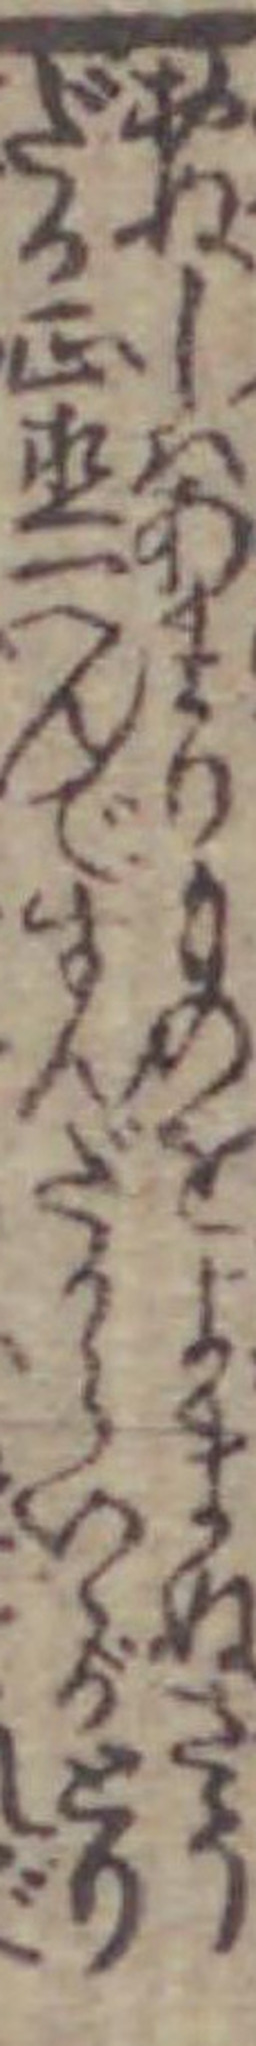だか正直一へんですんだからいゝがとり
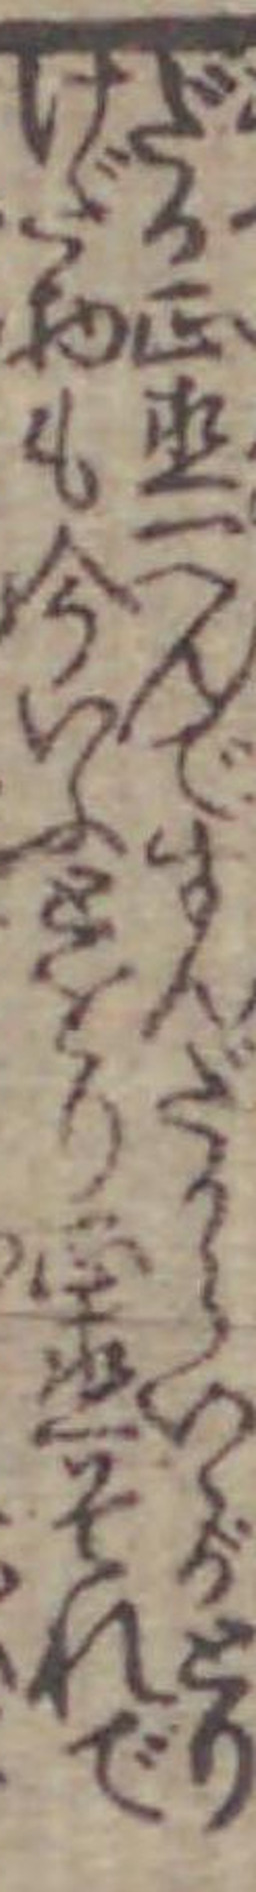けだ物も今いふとをり正直それで
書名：即席耳学問 : 3巻
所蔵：国立国会図書館 National Diet Library, JAPAN
